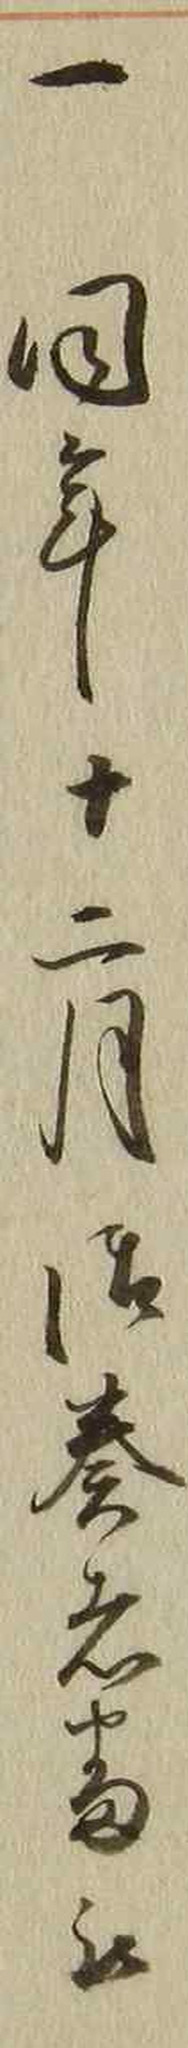一同年十二月御奏者番被
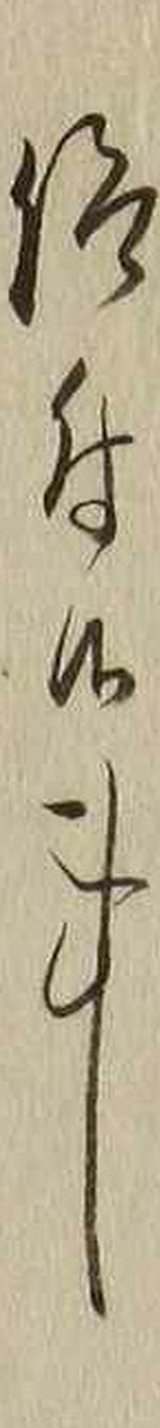仰付候事
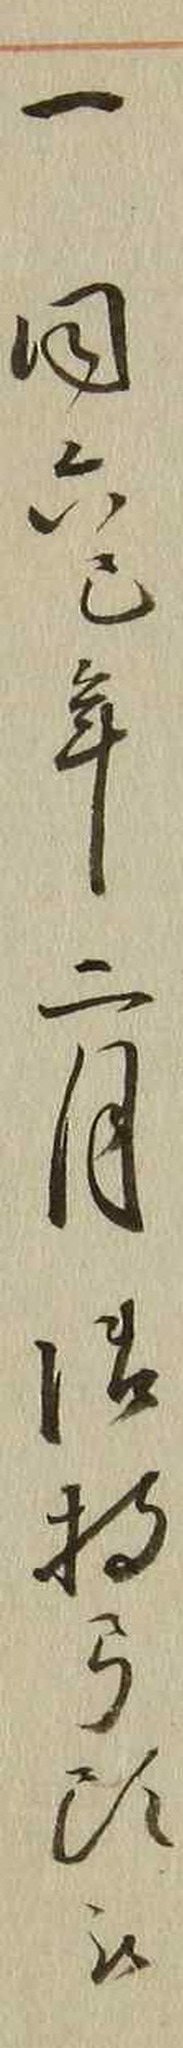一同六巳年二月御持弓頭被
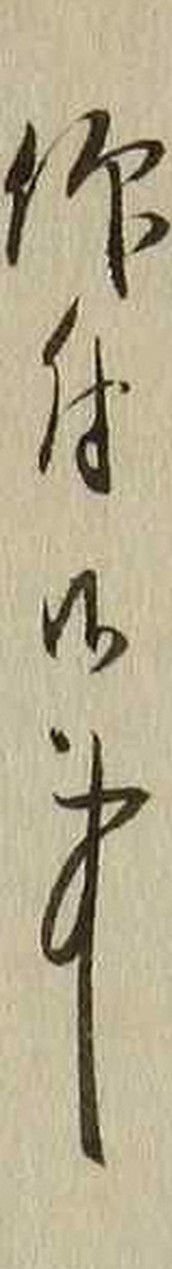仰付候事
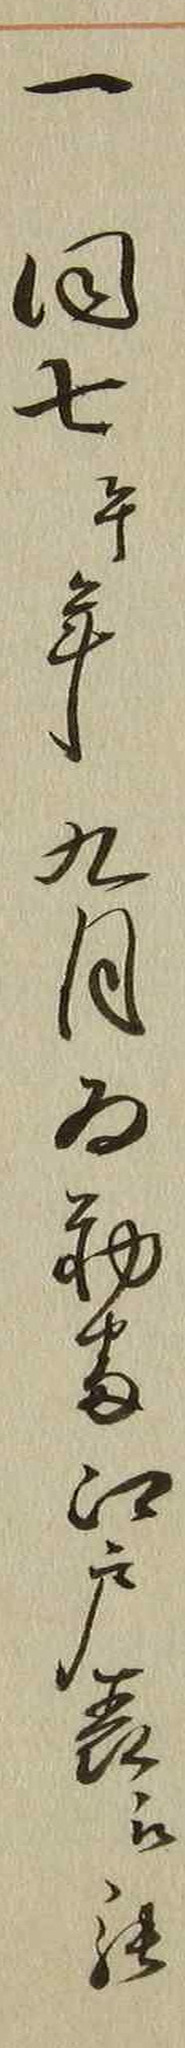一同七午年九月為勤番江戸表江罷
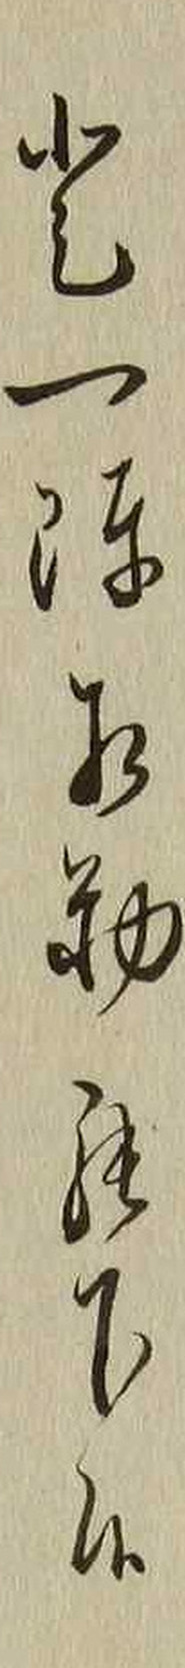登一陣相勤罷下候
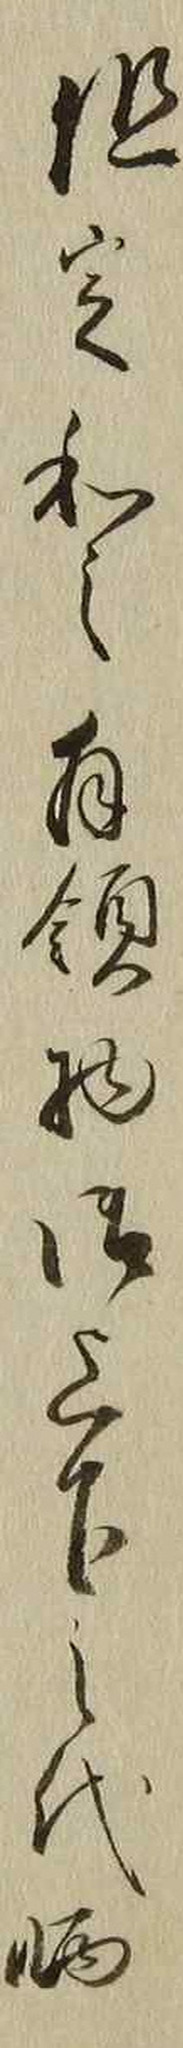但定和之拝領物御上下之代晒
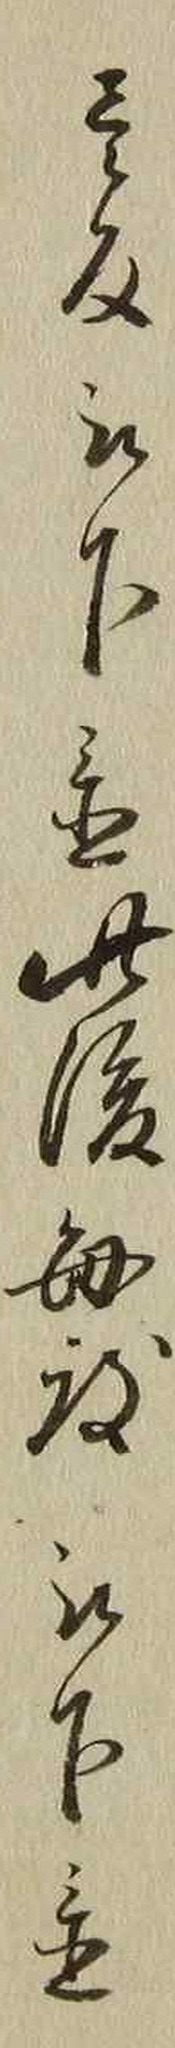壱反被下置此後毎度被下置
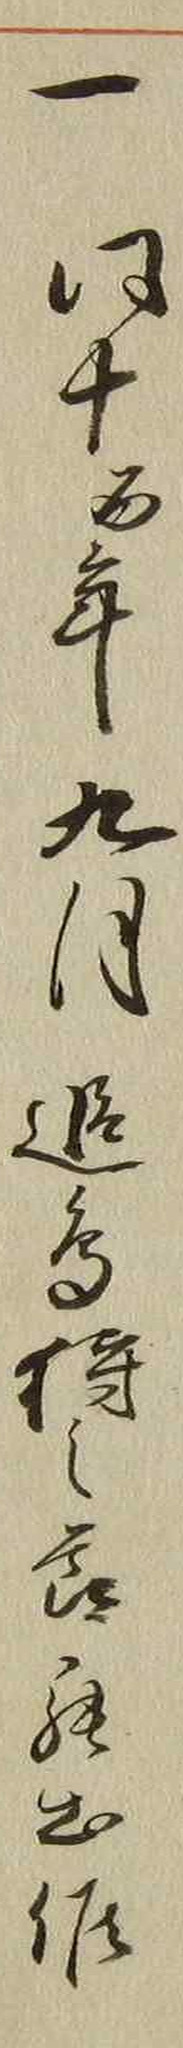一同十酉年九月追鳥狩之節罷出候
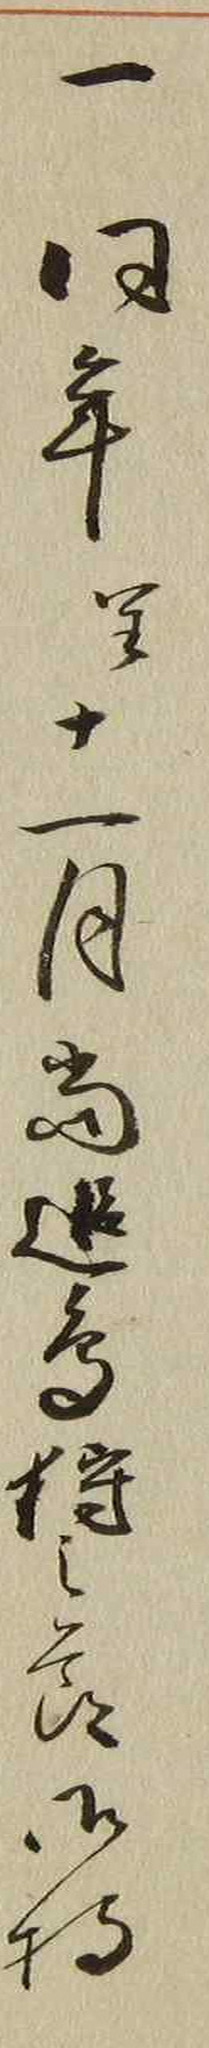一同年閏十一月当追鳥狩之節御持
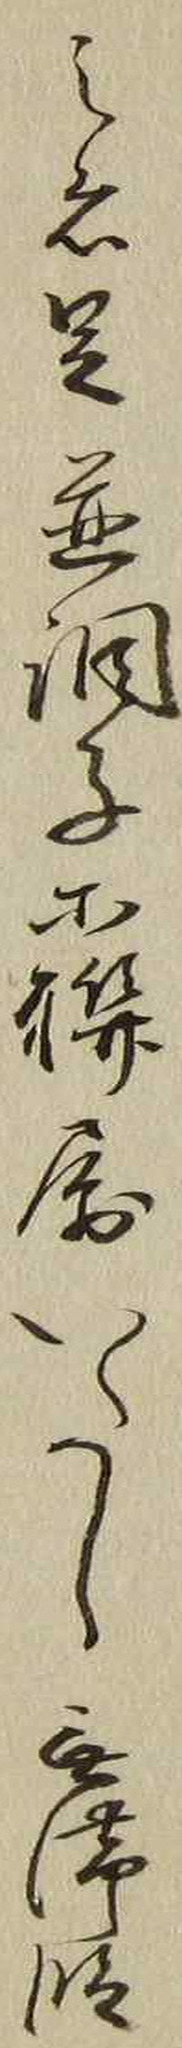之者足並調子等聯属いたし無滞段
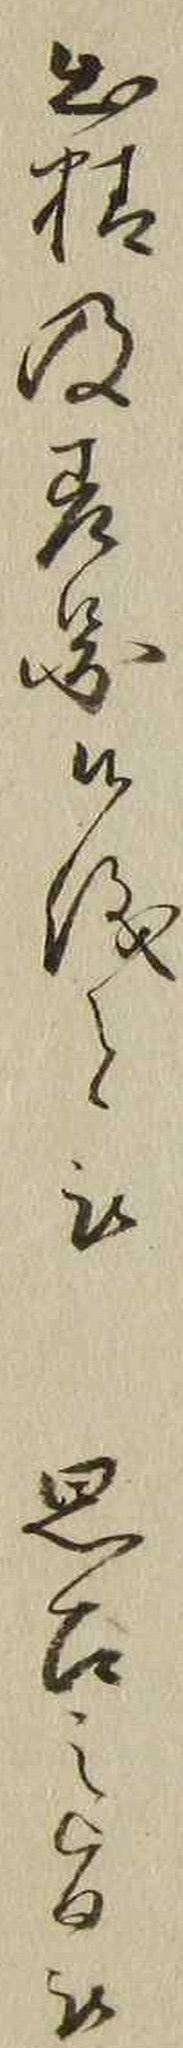出精及指図候儀と被思召之旨被
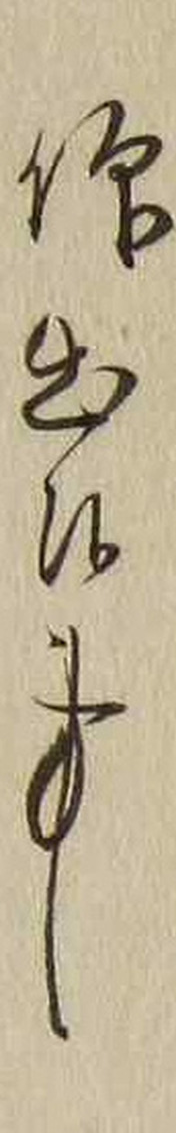仰出候事
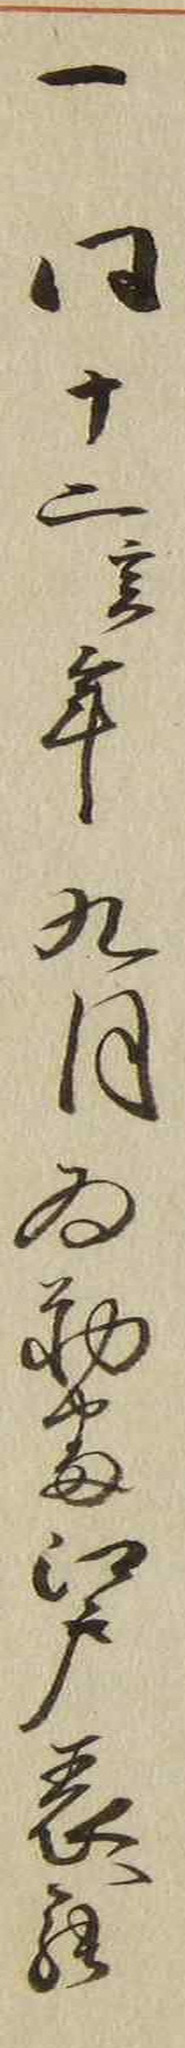一同十二亥年九月為勤番江戸表江罷

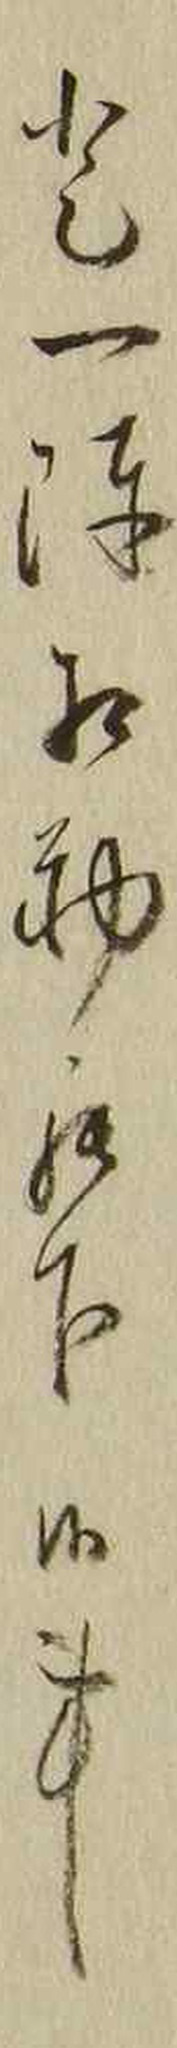登一陣相勤罷下候事
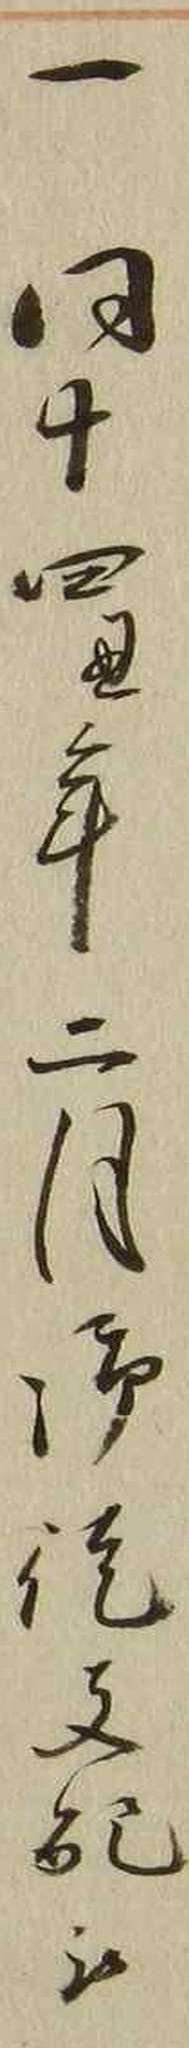一同十四丑年二月御徒支配被
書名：諸士系譜　巻之68　を之部2
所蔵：会津若松市立会津図書館
